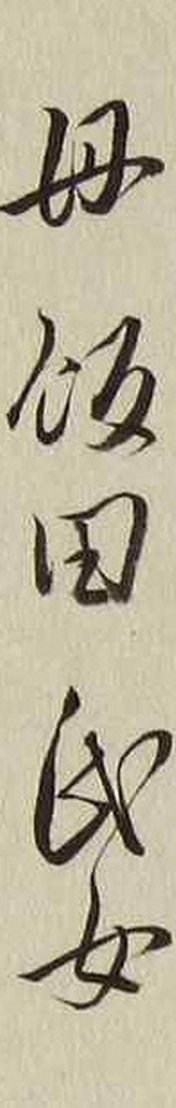母飯田氏女

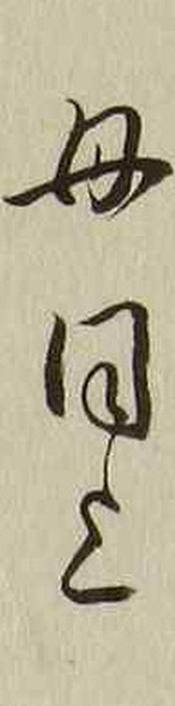母同上
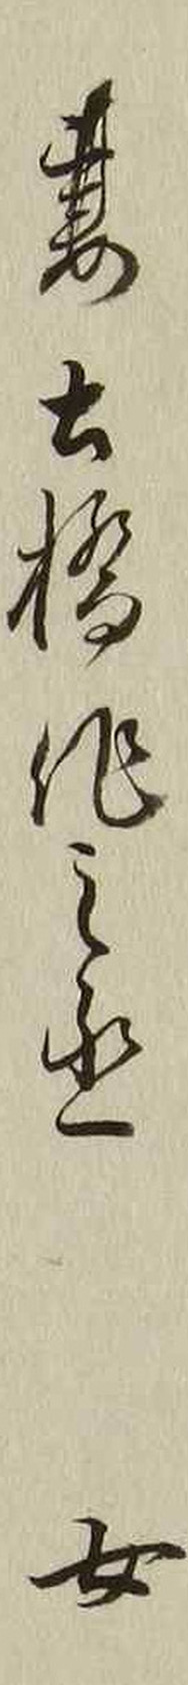妻土橋作之丞女
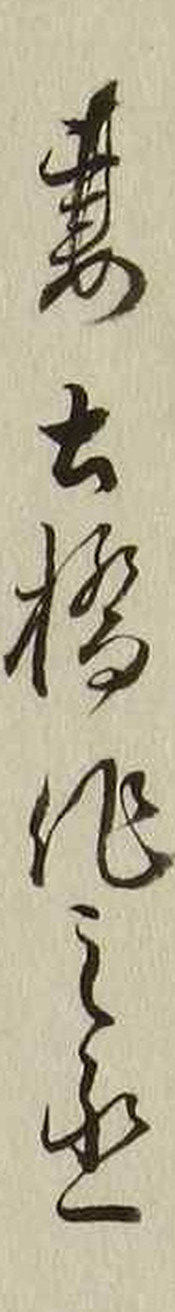妻土橋作之丞女
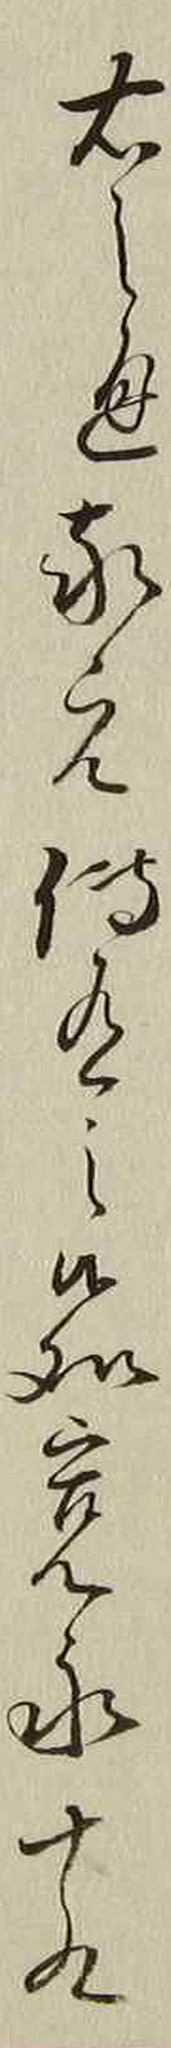右之通り家元傳有之候処寛永十九
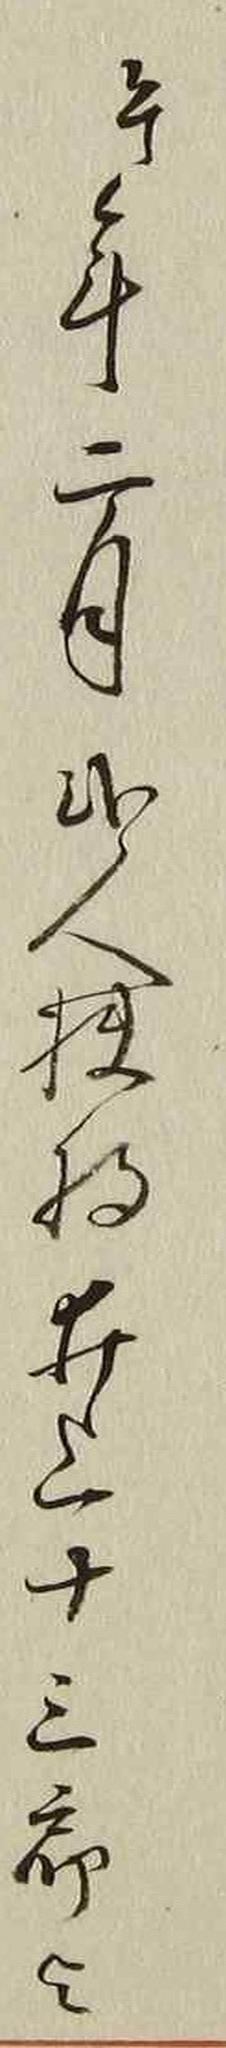午年二月弐人扶持井上十三郎と
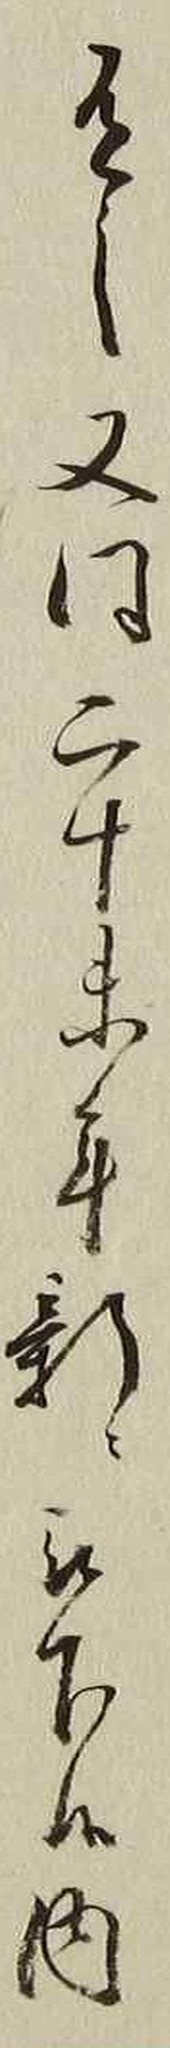有之又同二十未年新たニ下され候内
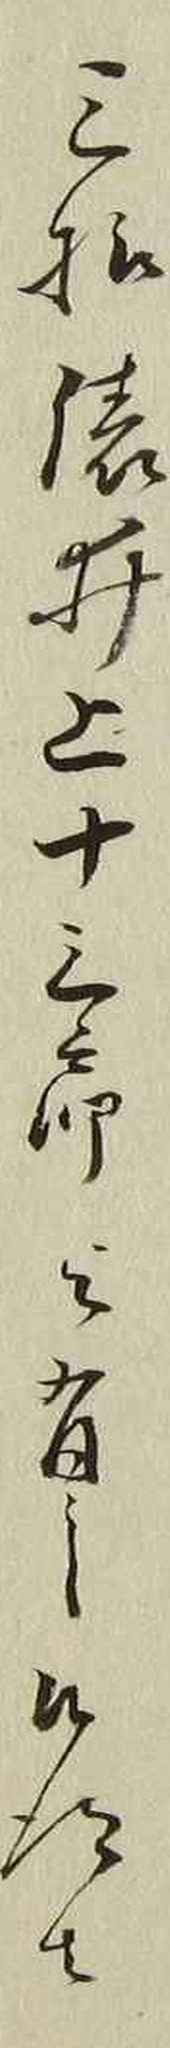三十俵井上十三郎と有之候得バ
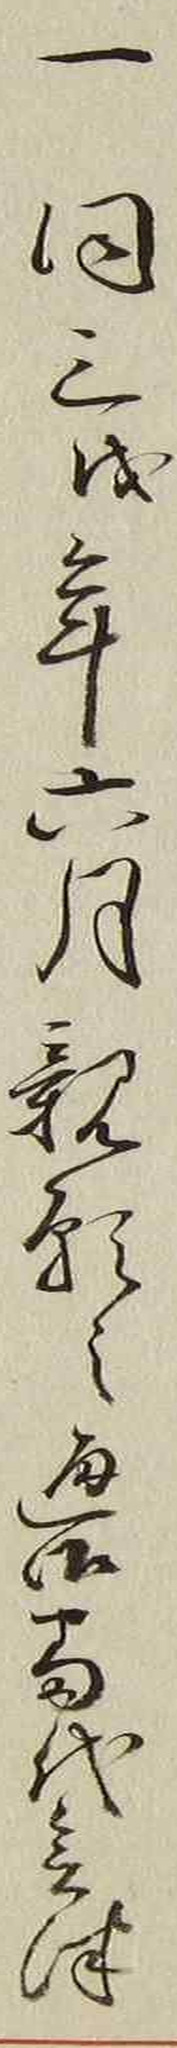一同三戌年六月親願い之通り御番代会津
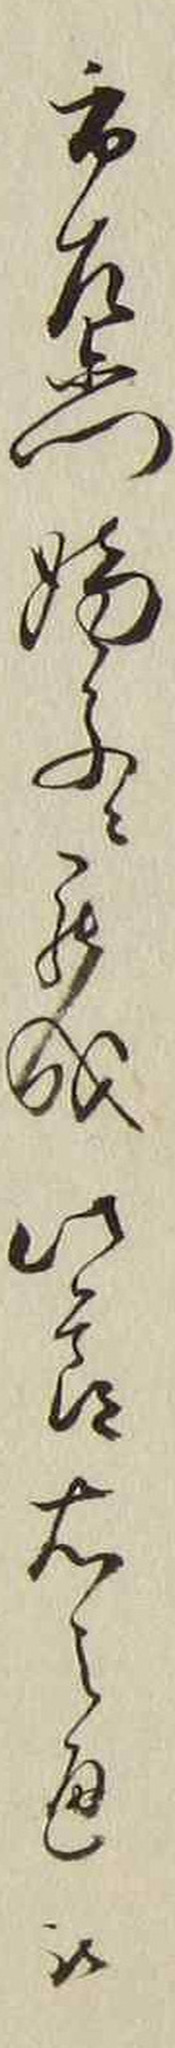市左衛門嫡子ニ罷り成り此節右之通り

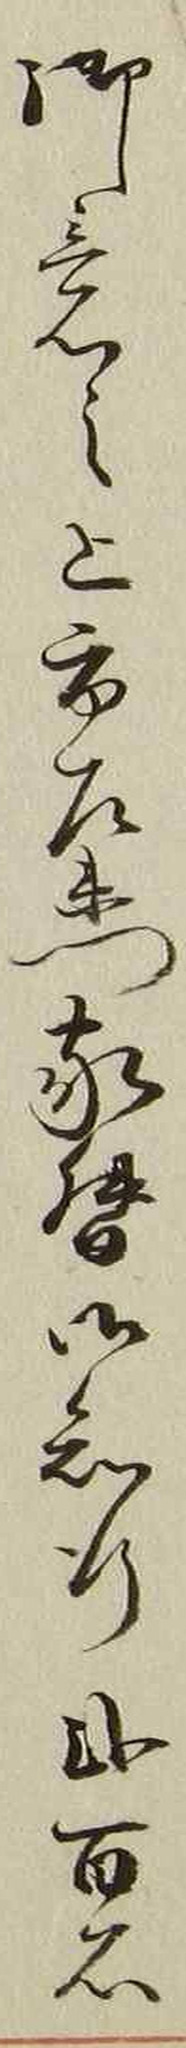御意之上市左衛門家督御知行弐百石
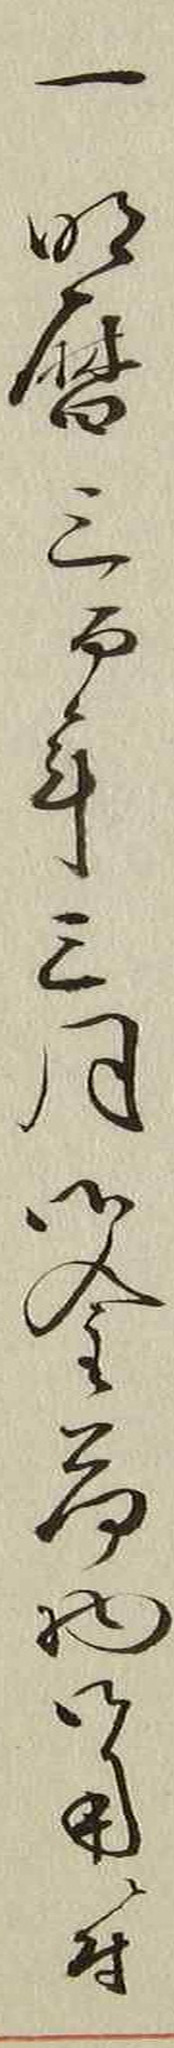一明暦三酉年三月御金荷物御用ニ付き
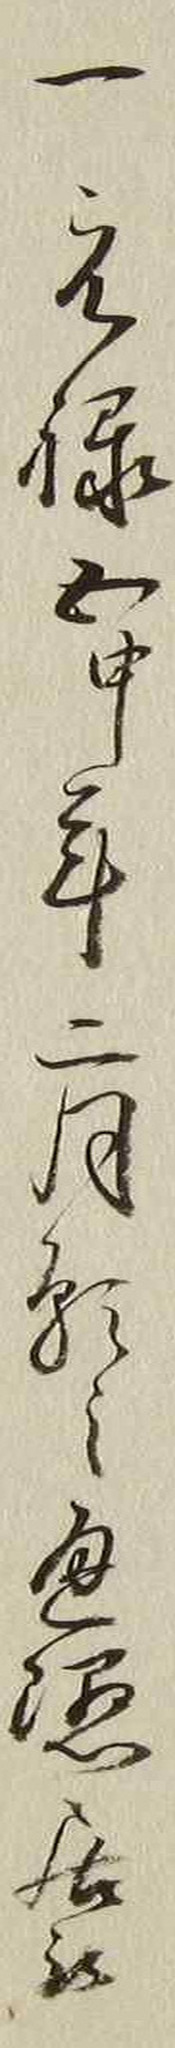一元禄五申年二月願い之通り隠居
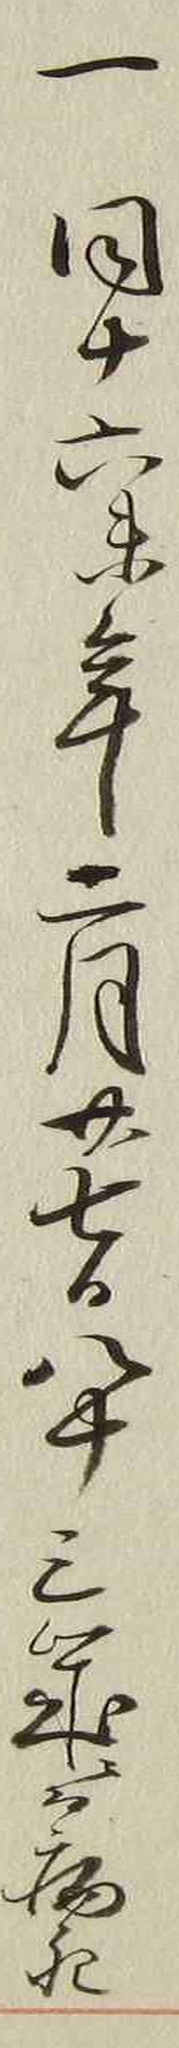一同十六未年二月廿七日八十三歳ニて病死
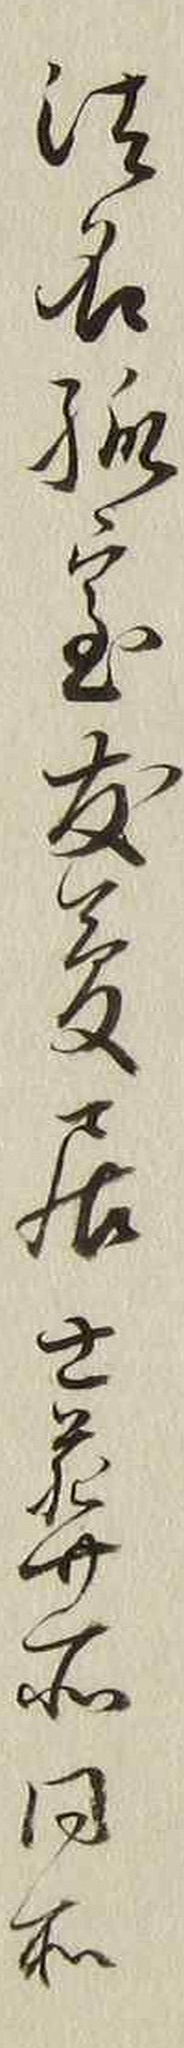法名孤室友夢居士葬所同所
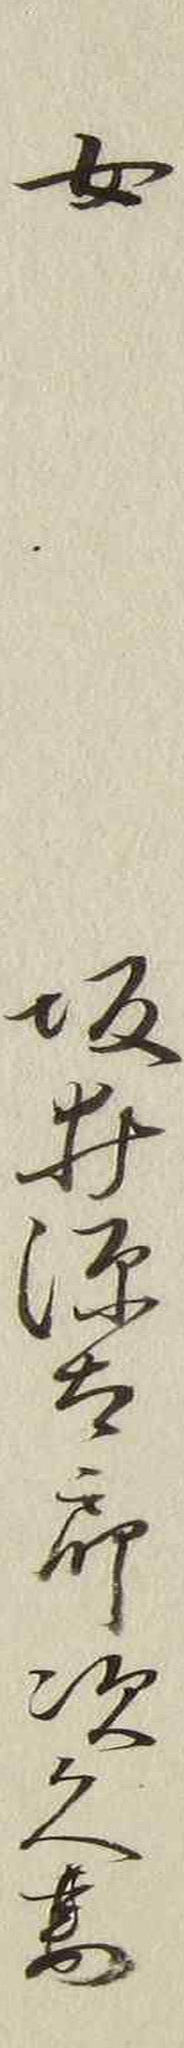女坂井源太郎次久妻
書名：諸士系譜　巻之20　い之部20
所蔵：会津若松市立会津図書館
